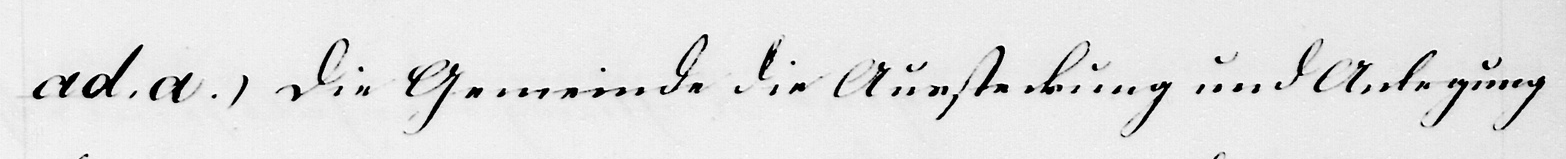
ad. a.) Die Gemeinde die Aussteckung und Anlegung
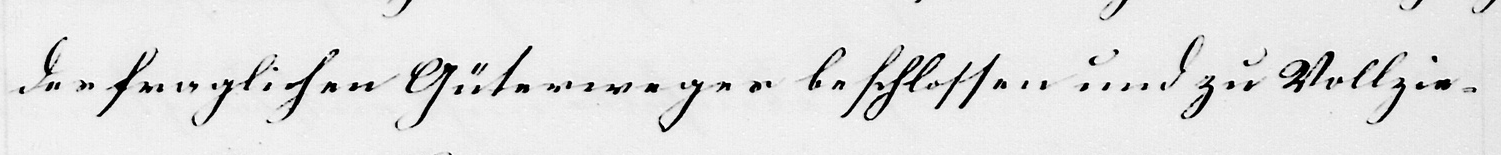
des fraglichen Güterweges beschlossen und zu Vollzie¬
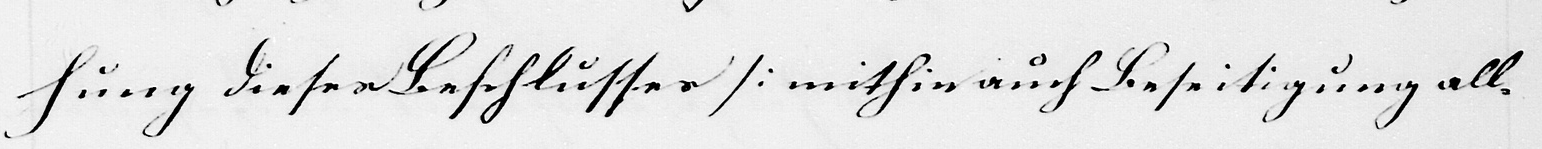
hung dieses Beschlusses [mithin auch Beseitigung all¬
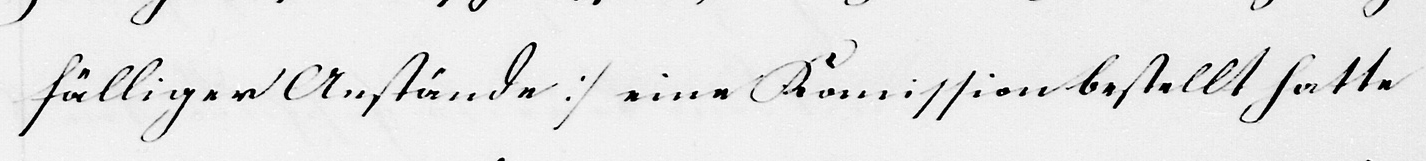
fälliger Anstände] eine Komission bestellt hatte
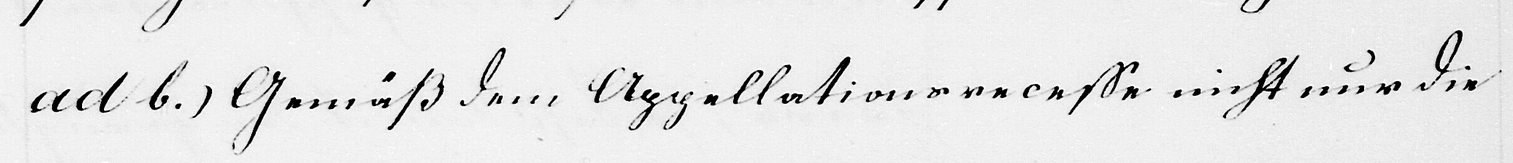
ad b.) Gemäß dem Appellationsreceße nicht nur die
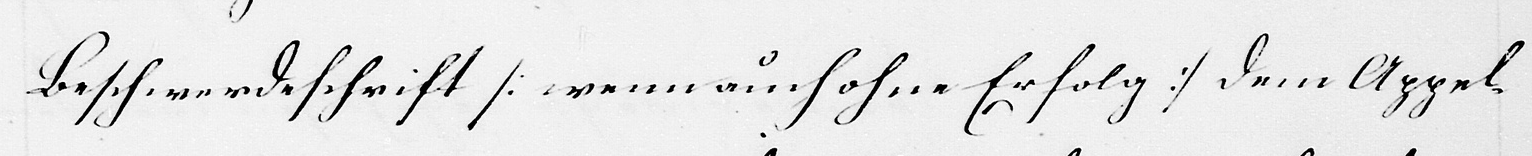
Beschwerdeschrift [wenn auch ohne Erfolg] dem Appel¬
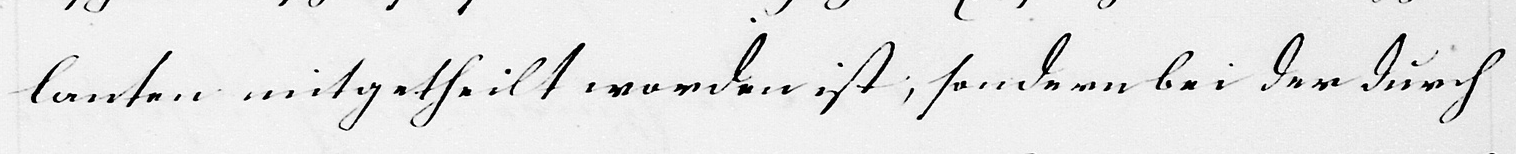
lanten mitgetheilt worden ist, sondern bei der durch
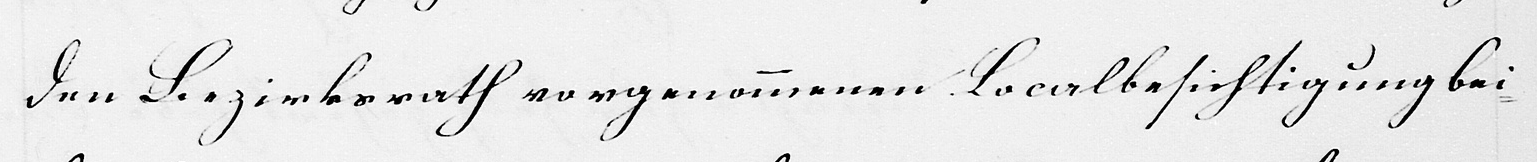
den Bezirksrath vorgenommenen Localbesichtigung bei¬
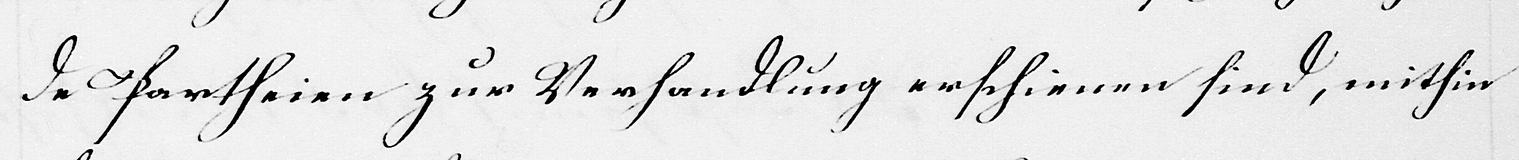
de Partheien zur Verhandlung erschienen sind, mithin
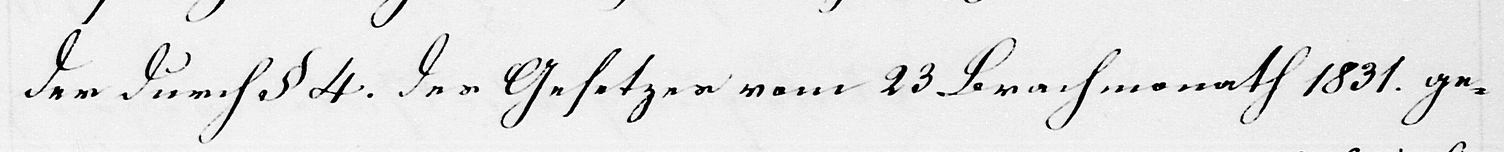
der durch § 4. des Gesetzes vom 23 Brachmonath 1831. ge¬
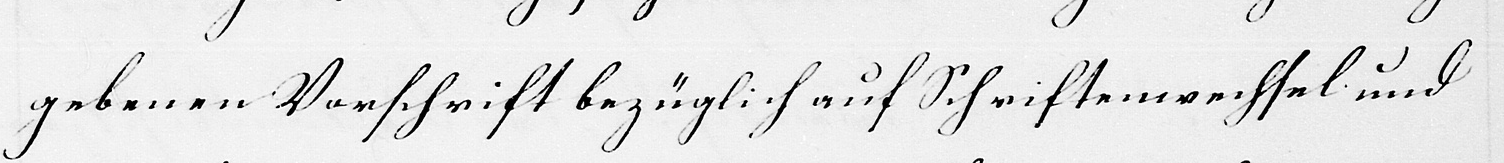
gebenen Vorschrift bezüglich auf Schriftenwechsel und
